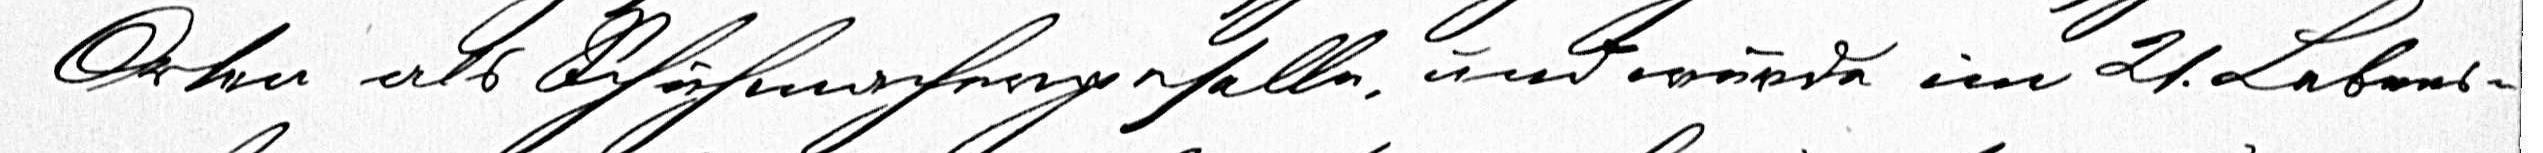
Orten als Schuhmachergeselle, und wurde in 21. Lebens¬
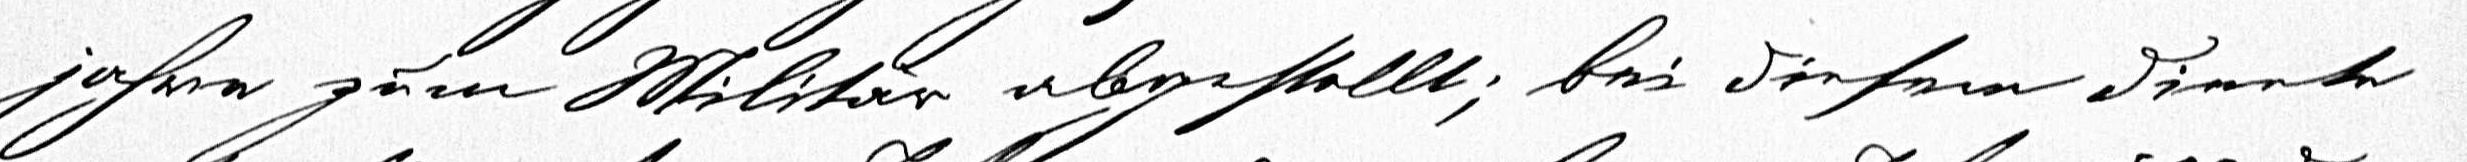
jahre zum Militär abgestellt; bei diesem diente
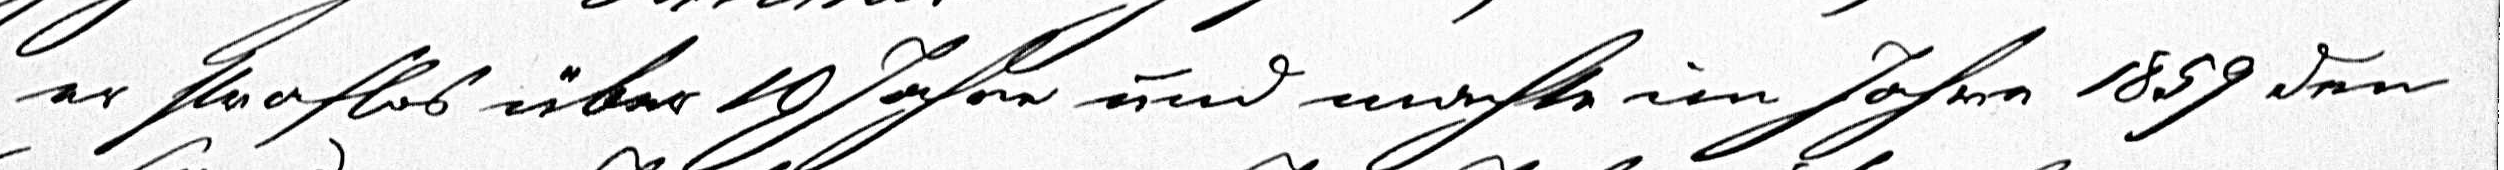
er straflos über 10 Jahre und machte im Jahre 1859 den
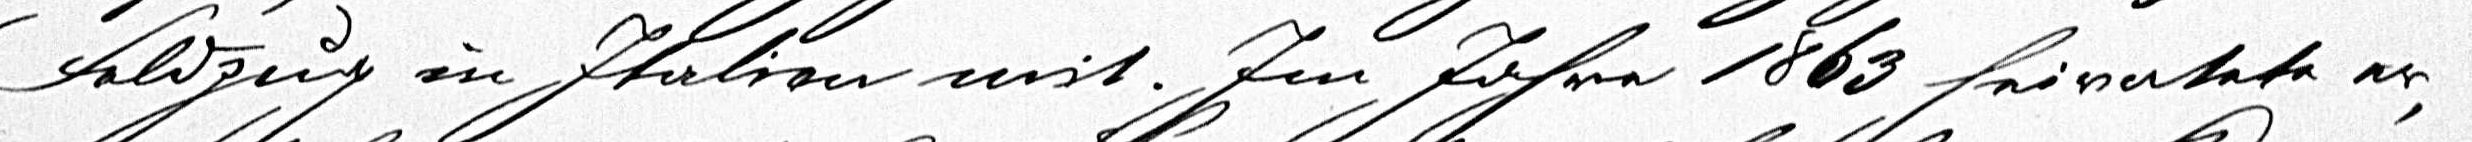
Feldzug in Italien mit. Im Jahre 1863 heiratete er,
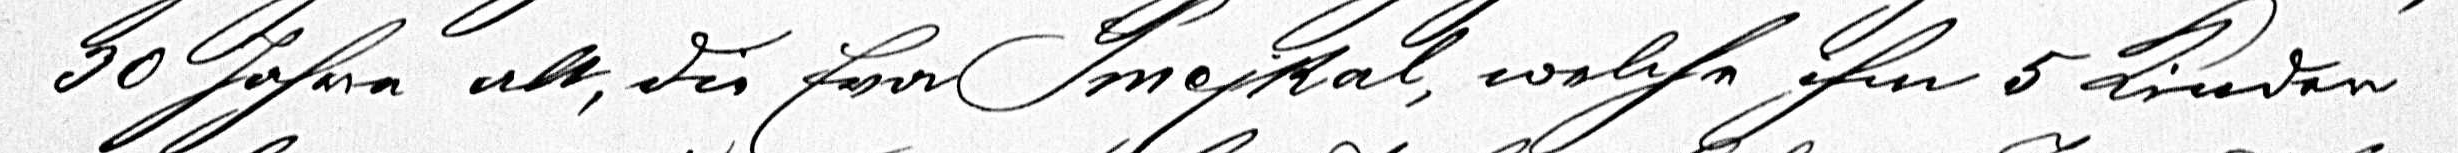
30 Jahre alt, die Eva Smejkal, welche ihm 5 Kinder
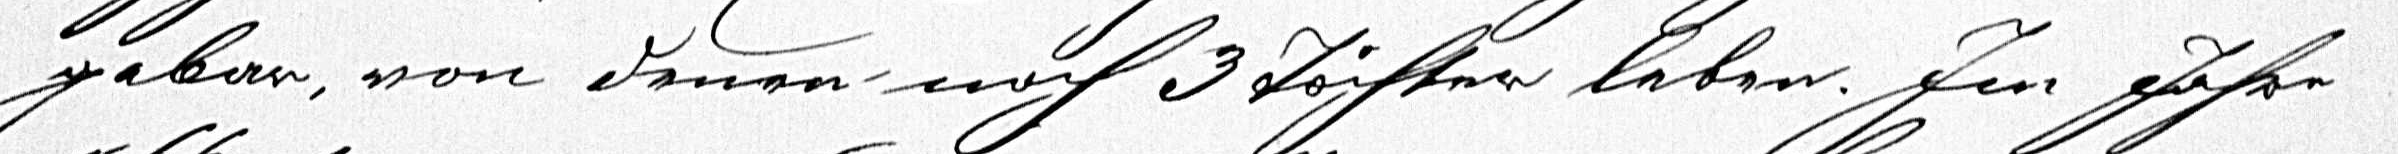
gebar, von denen noch 3 Töchter leben. Im Jahre
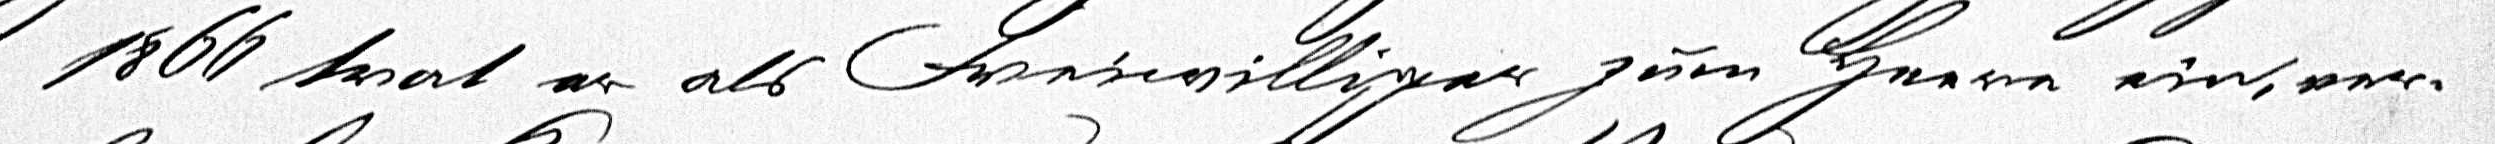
1866 trat er als Freiwilliger zum Heere ein, ver¬
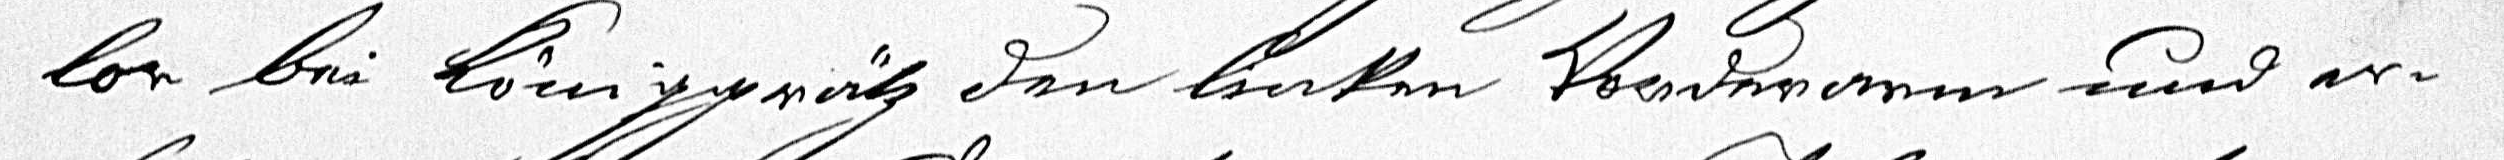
lor bei Königgrätz den linken Vorderarm und er¬
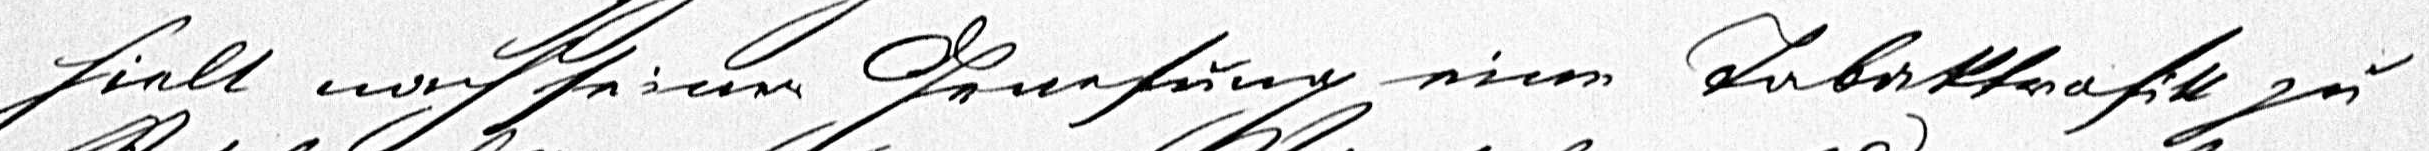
hielt nach seiner Genesung eine Tabaktrafik zu
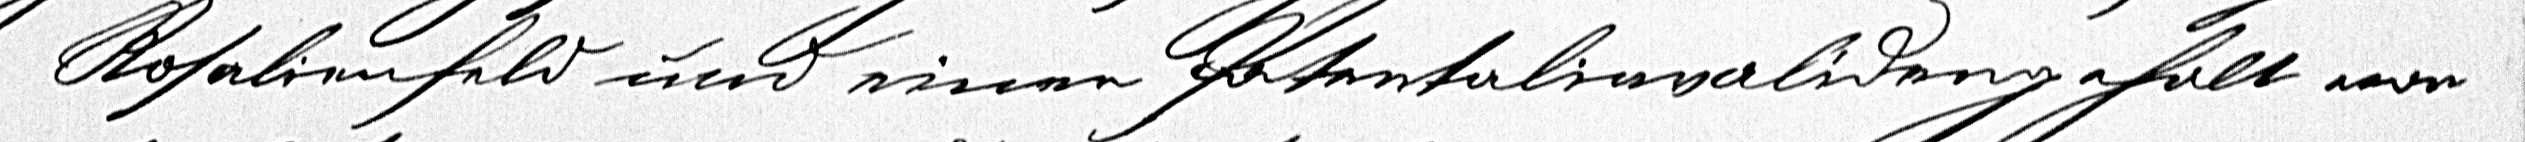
Rosalienfeld und einen Patentalinvalidengehalt von
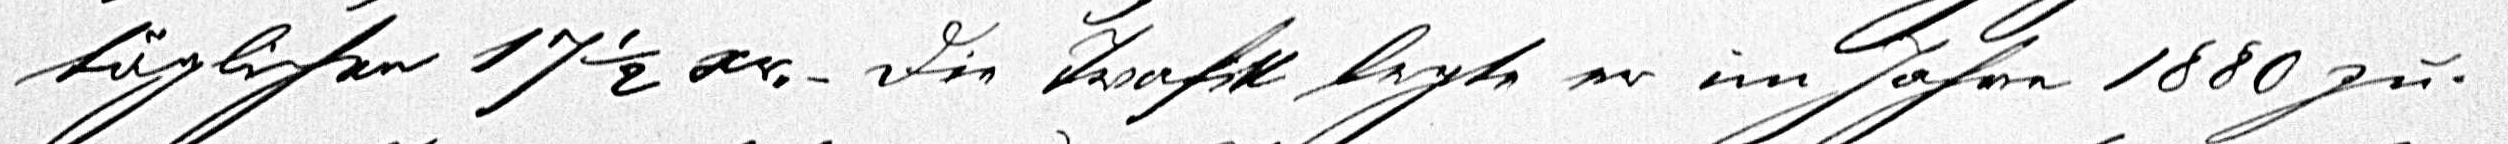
täglichen 17 ½ xr. Die Trafik legte er im Jahre 1880 zu¬
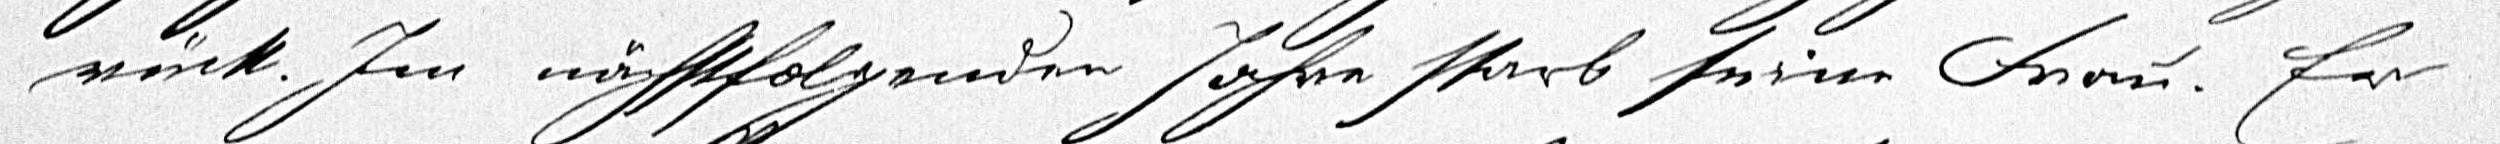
rück. Im nächstfolgenden Jahre starb seine Frau. Er
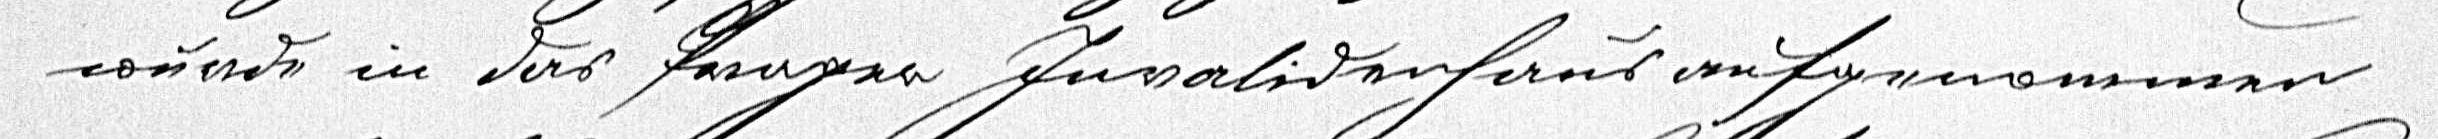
wurde in das Prager Invalidenhaus aufgenommen
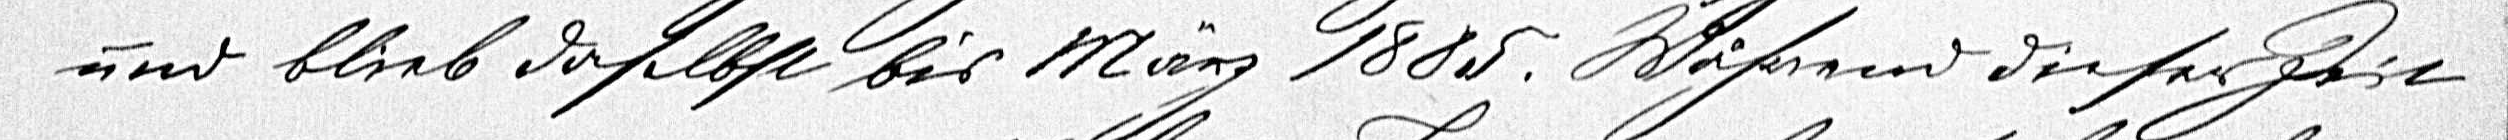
und blieb daselbst bis März 1885. Während dieser Zeit
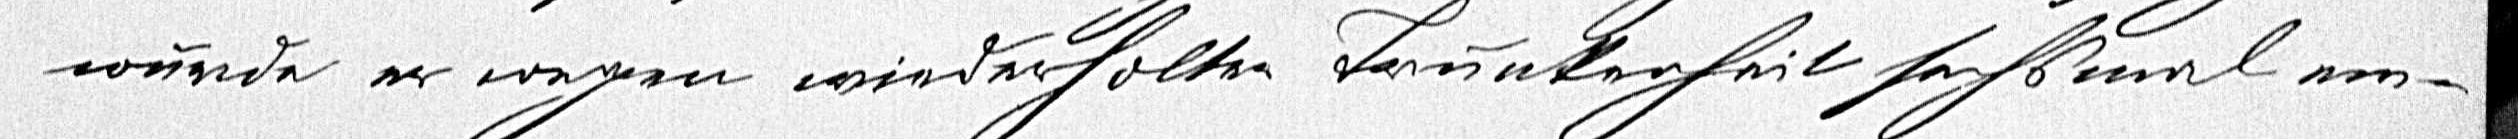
wurde er wegen weiderholten Trunkenheit sechsmal em¬
